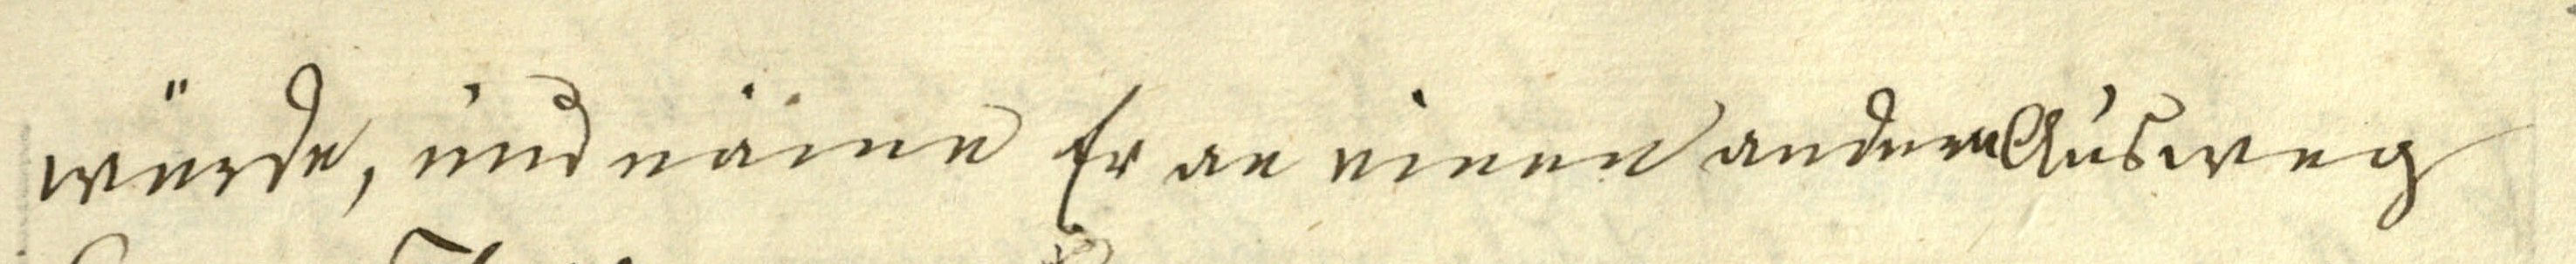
würde, und näme Er an einen andern Ausweg
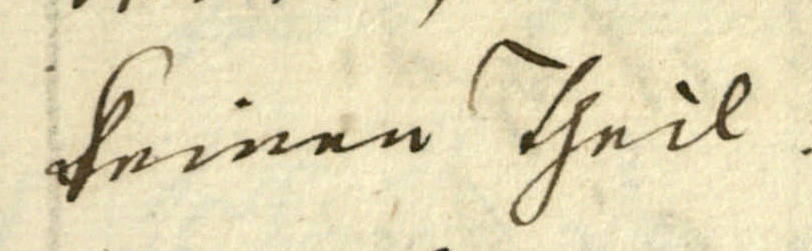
keinen Theil.
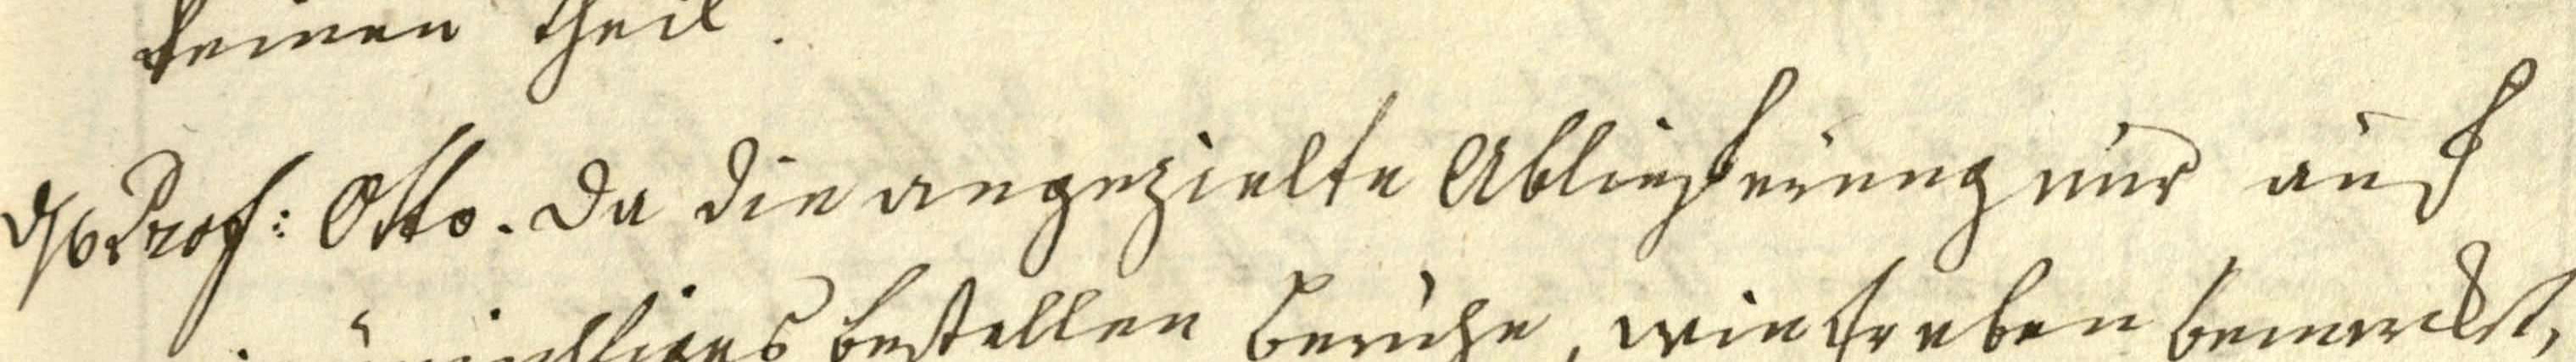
dh Prof. Otto. Da die angezielte Ablieferung nur auf
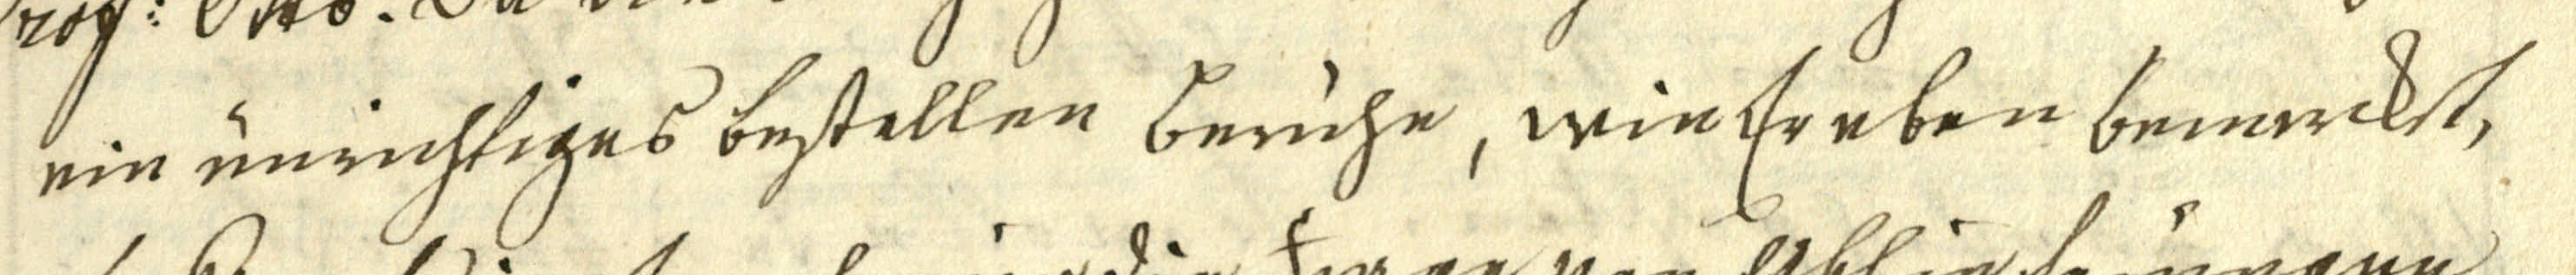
ein unrichtiges Bestellen beruhe, wie Er eben bemerckt,
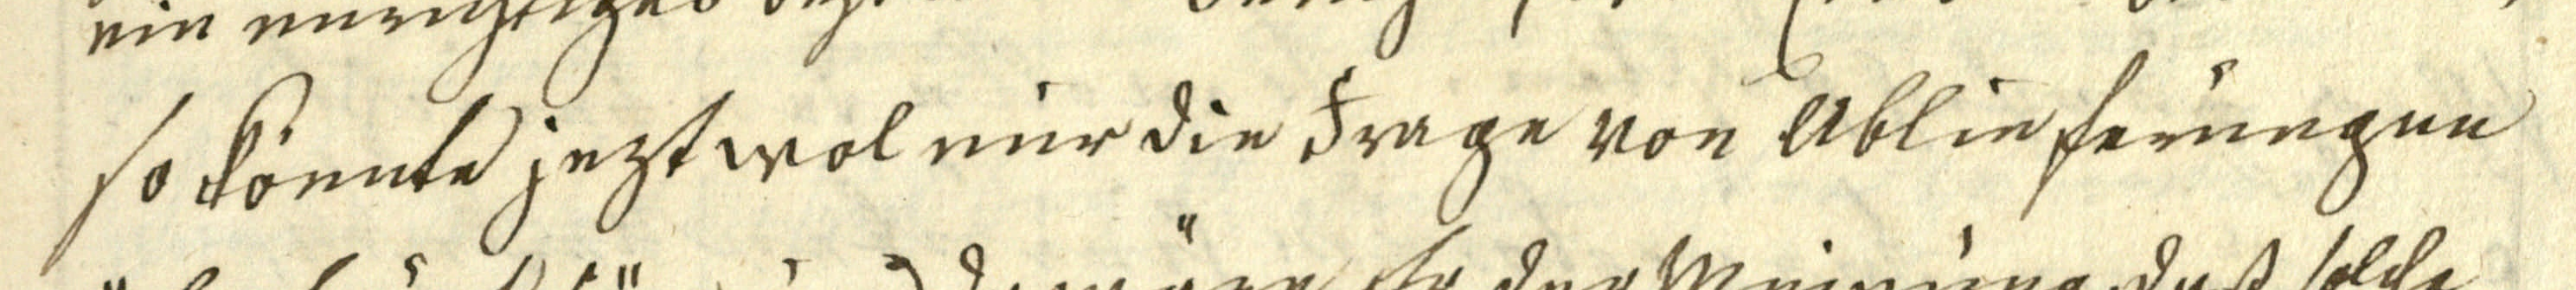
so könnte jezt wol nur die Frage von Ablieferungen
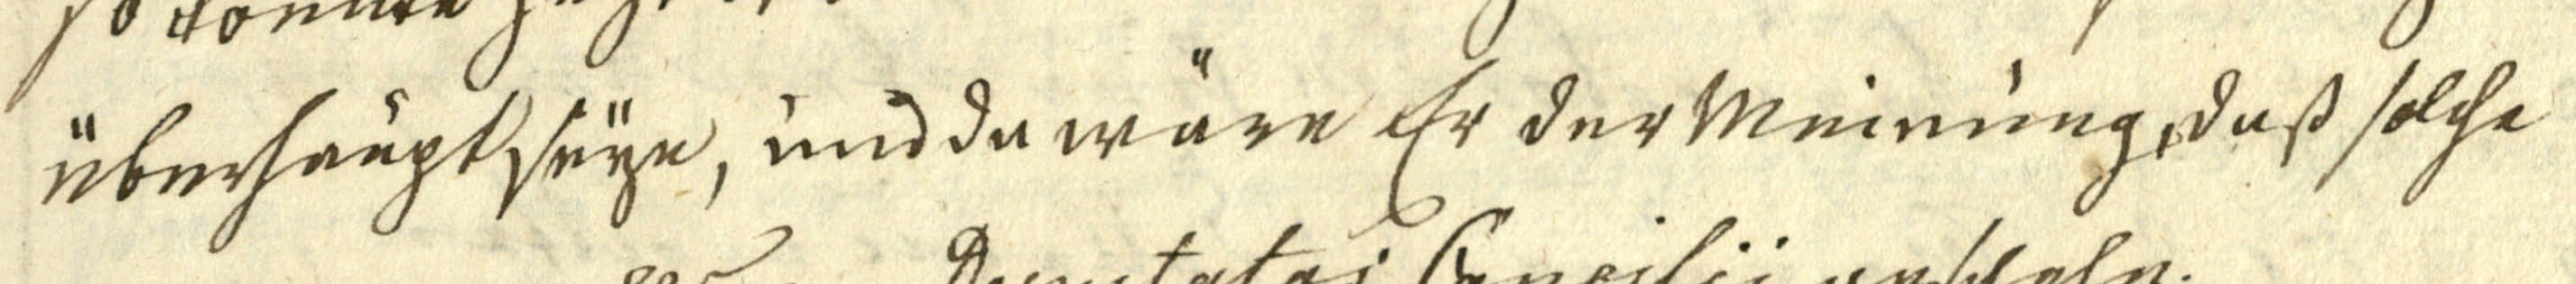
überhaupt seÿn, und da wäre Er der Meinung ,daß solche
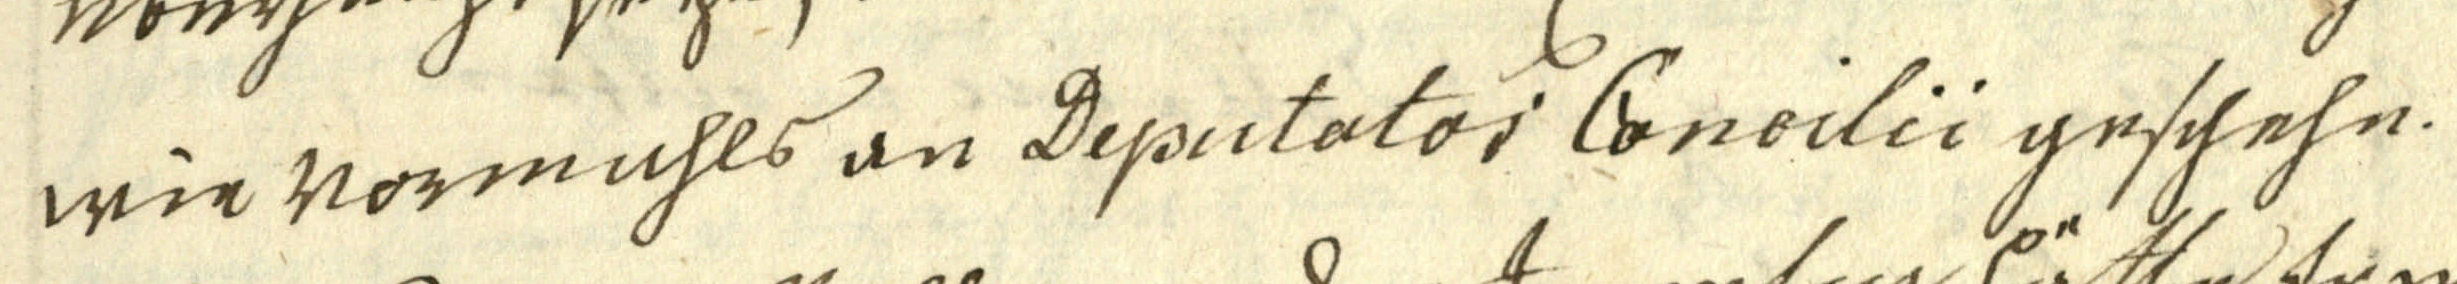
wie vormahls an Deputatos Concilii geschehe.
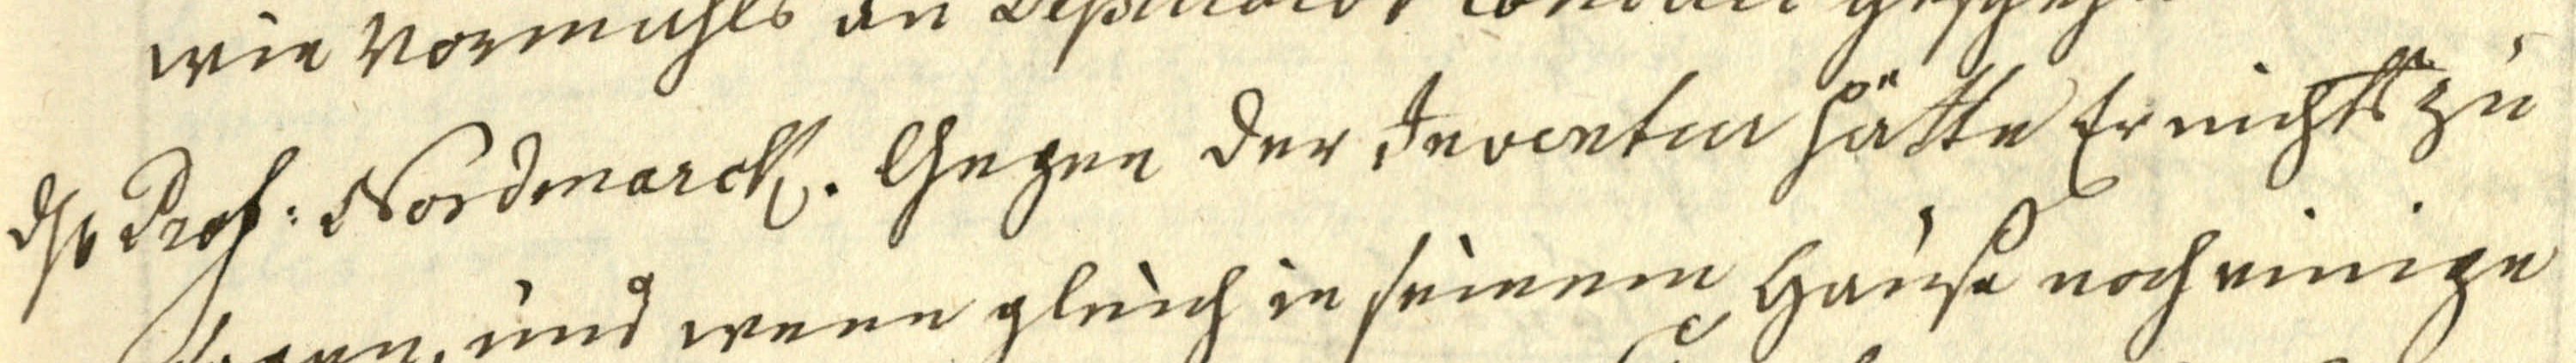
dh Prof. Nordmarck. Gegen der Inventur hätte Er nichts zu
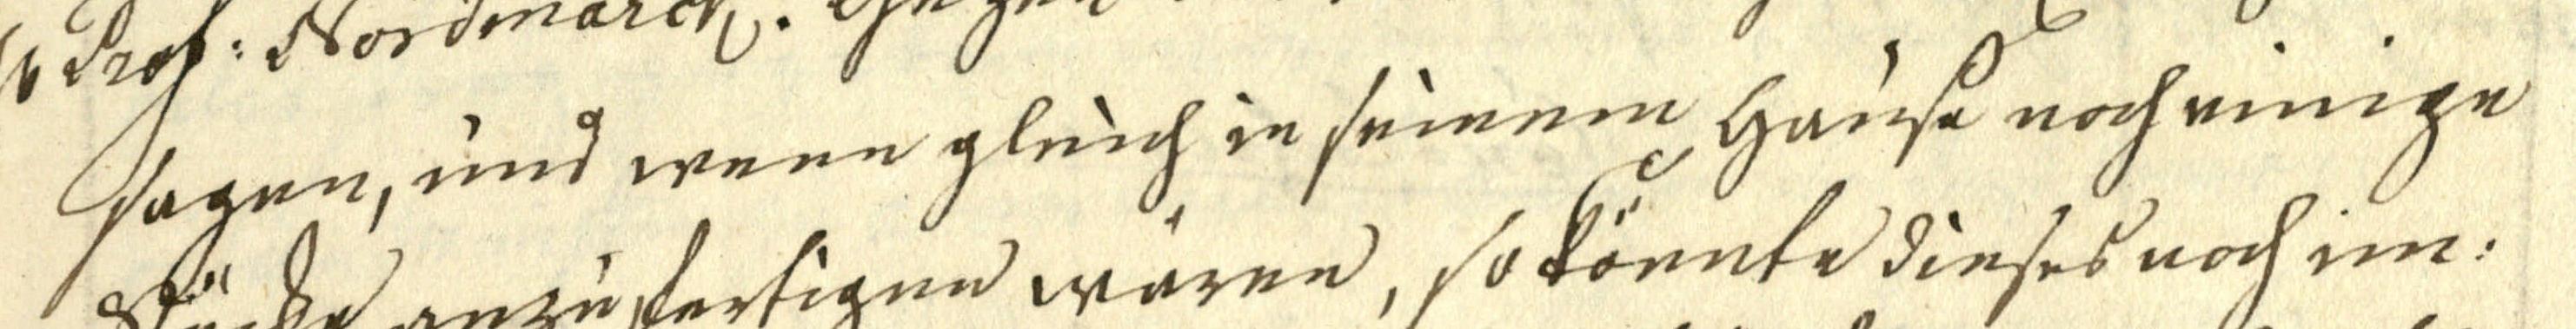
sagen, und wenn gleich in seinen Hause noch einige
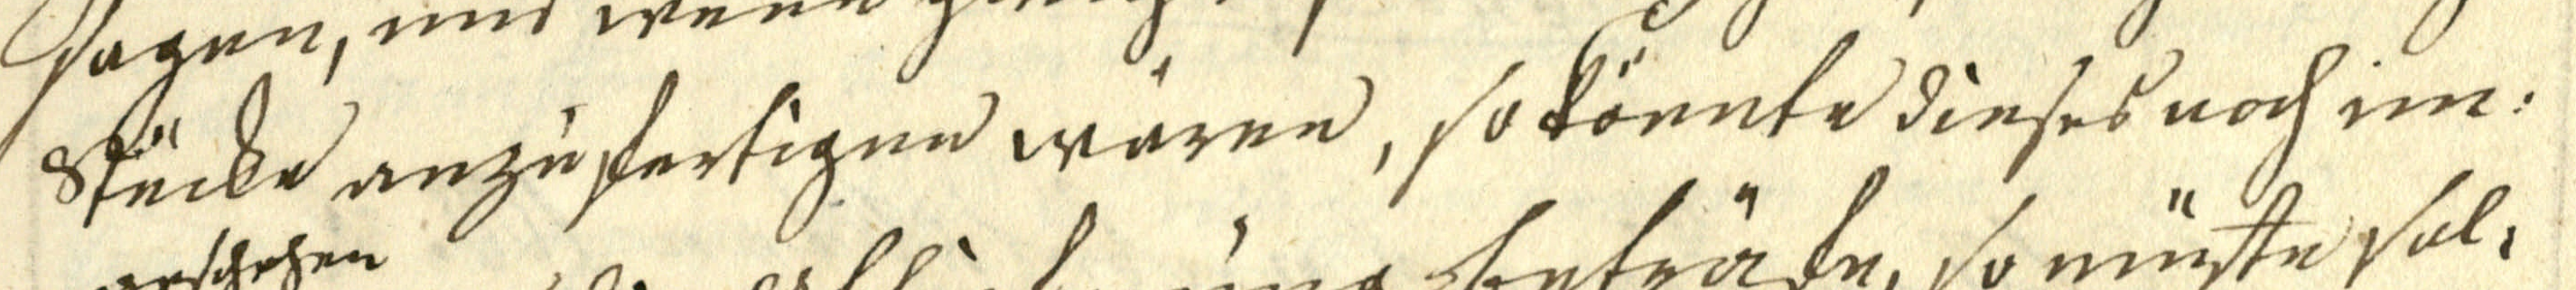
Stückee anzufertigen wären, so könnte dieses noch im¬
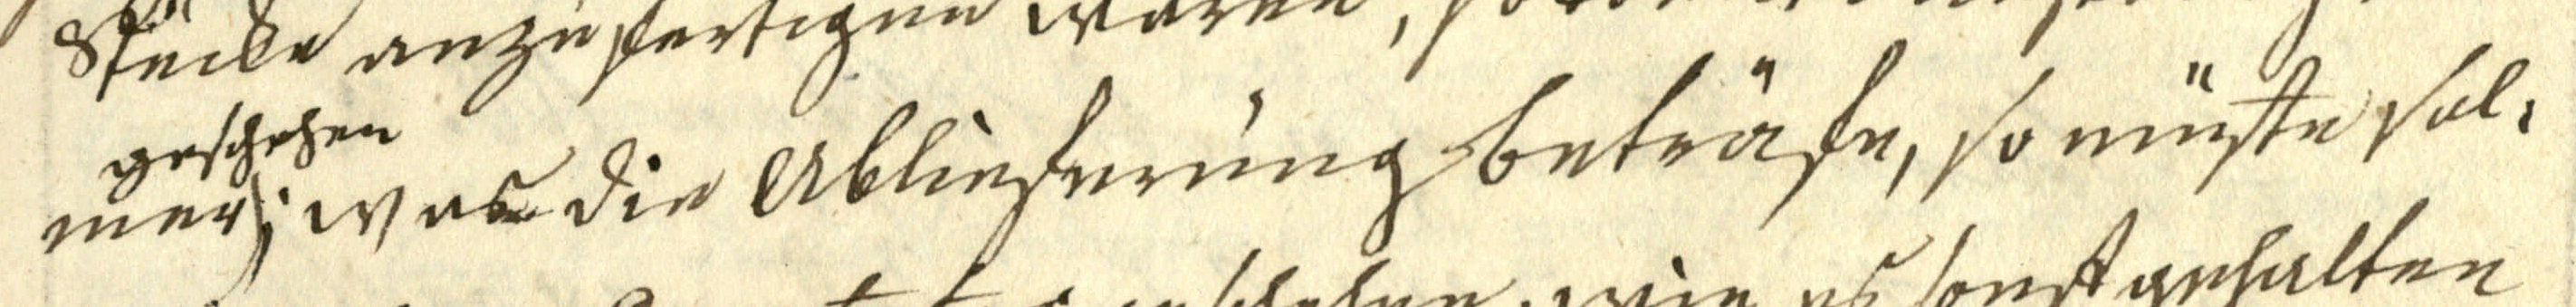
immer geschehen, was die Ablieferung beträfe, so müste sol¬
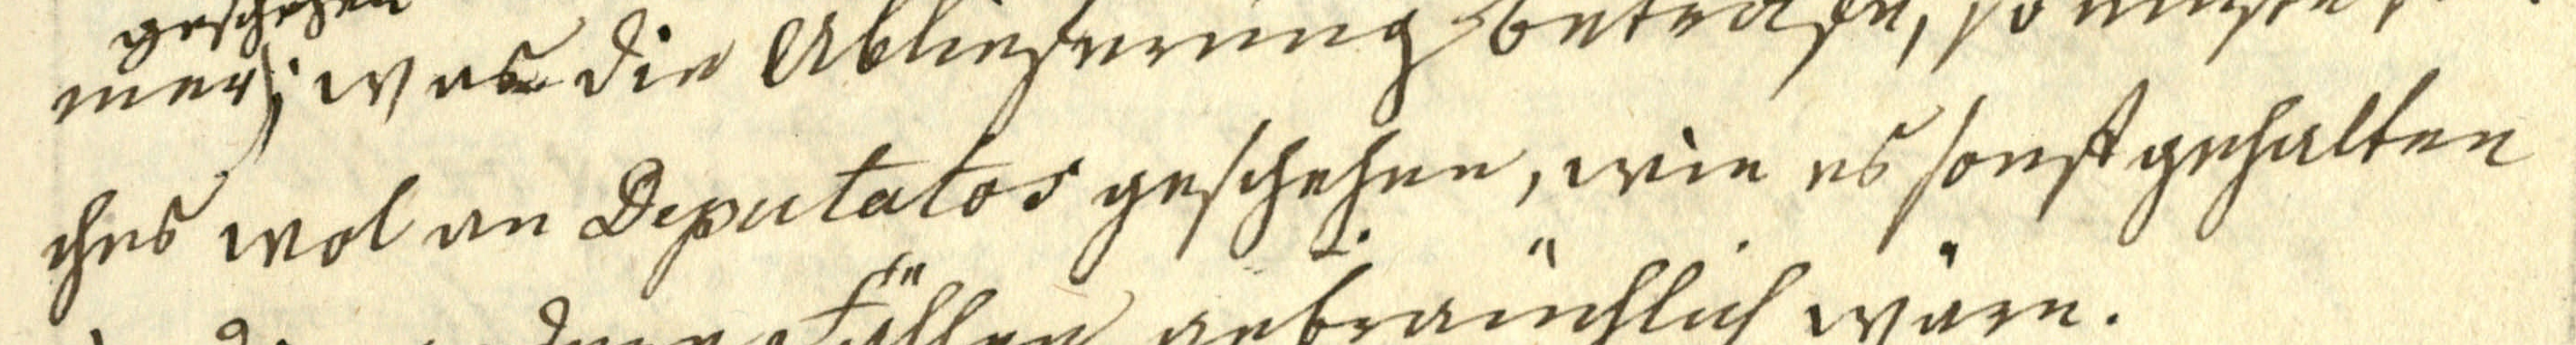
ches wol an Deputatos geschehen, wie es sonst gehalten
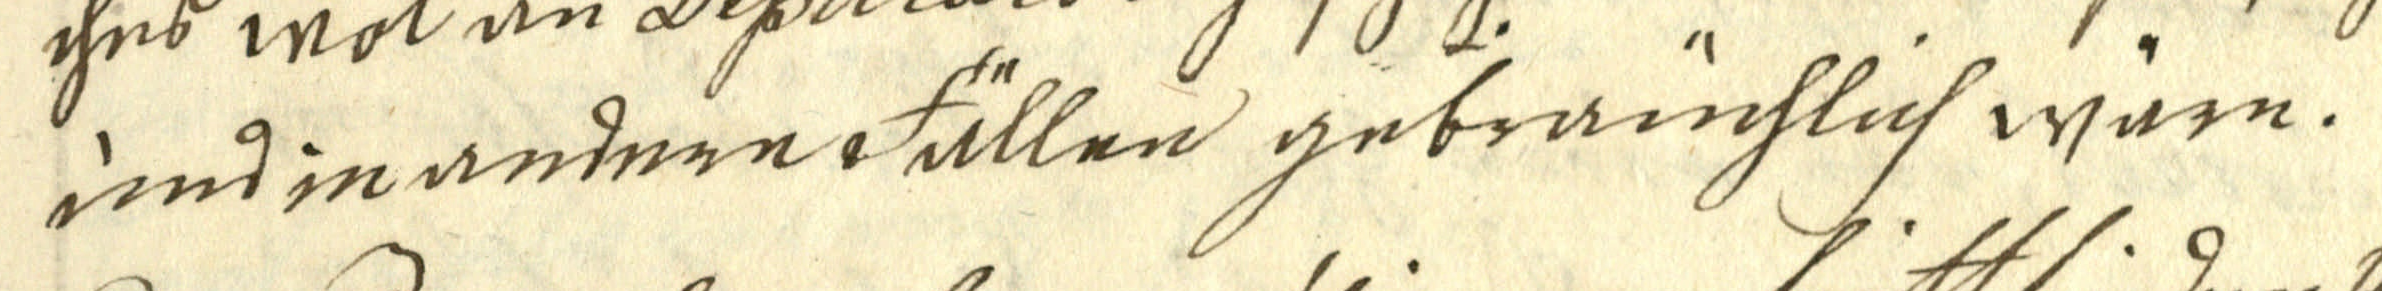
und in andern Fällen gebräuchlich wäre.
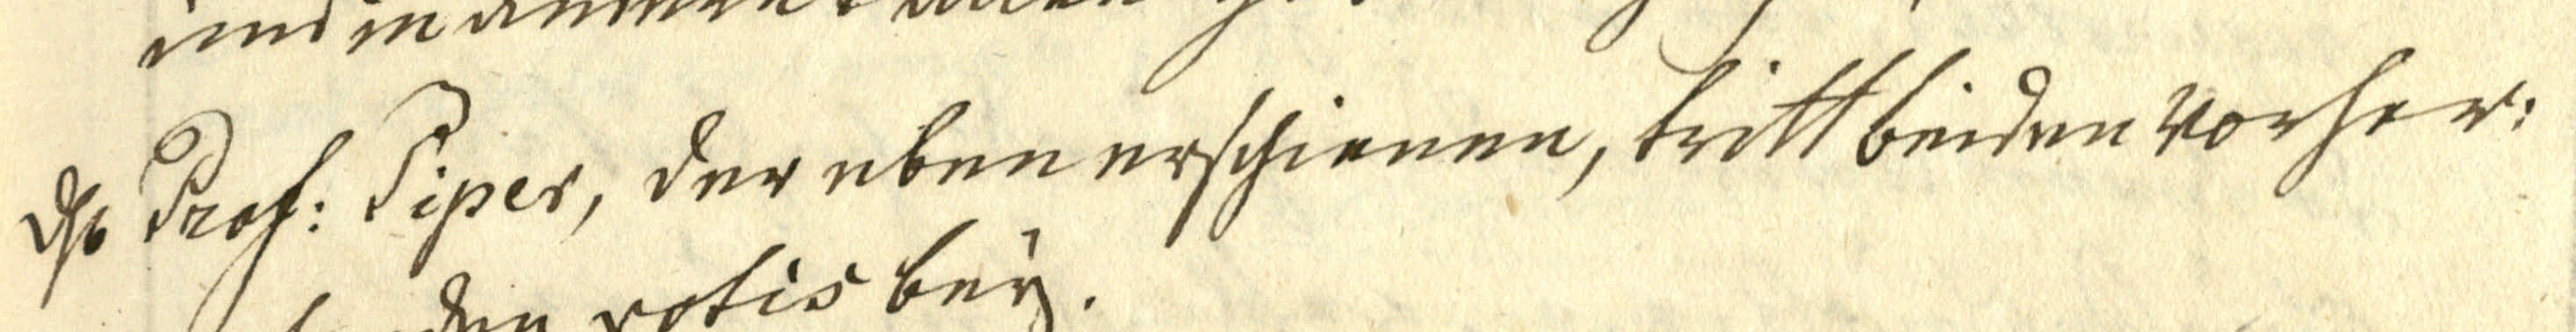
dh Prof. Piper, der eben erschienen, tritt beiden vorher¬
